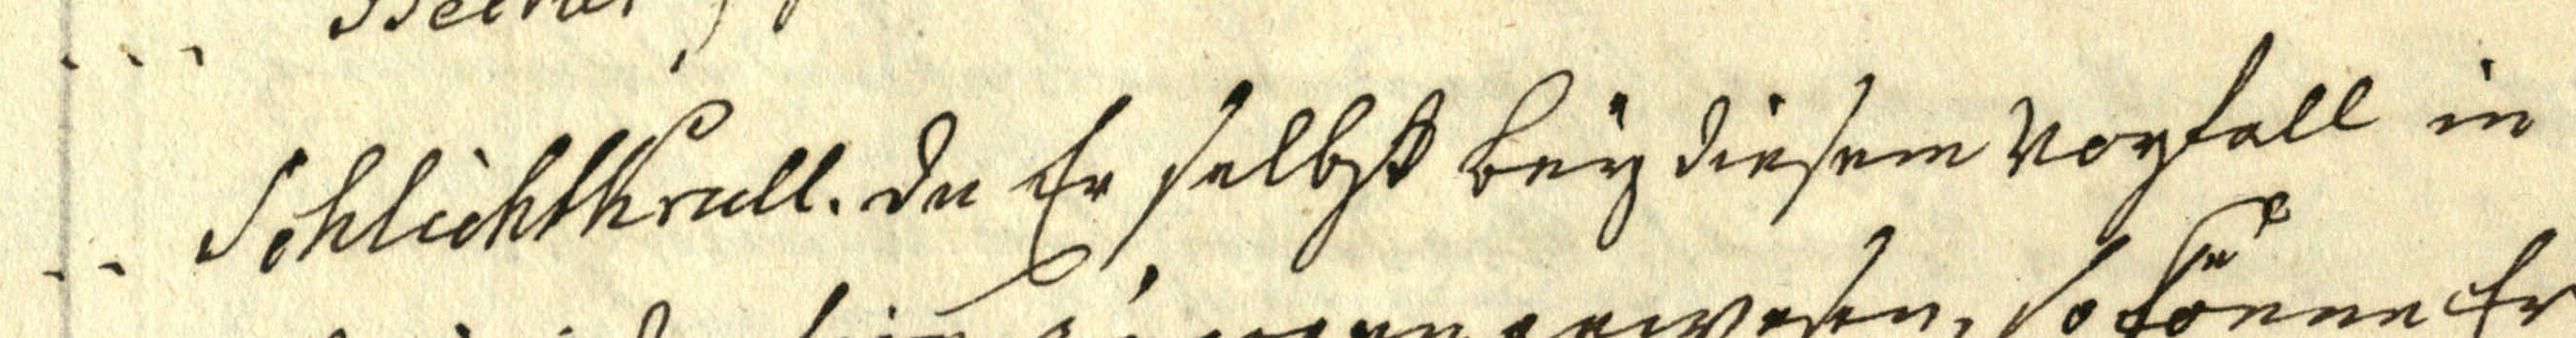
Schlichtkrull. Da Er selbst beÿ diesem Vorfall in
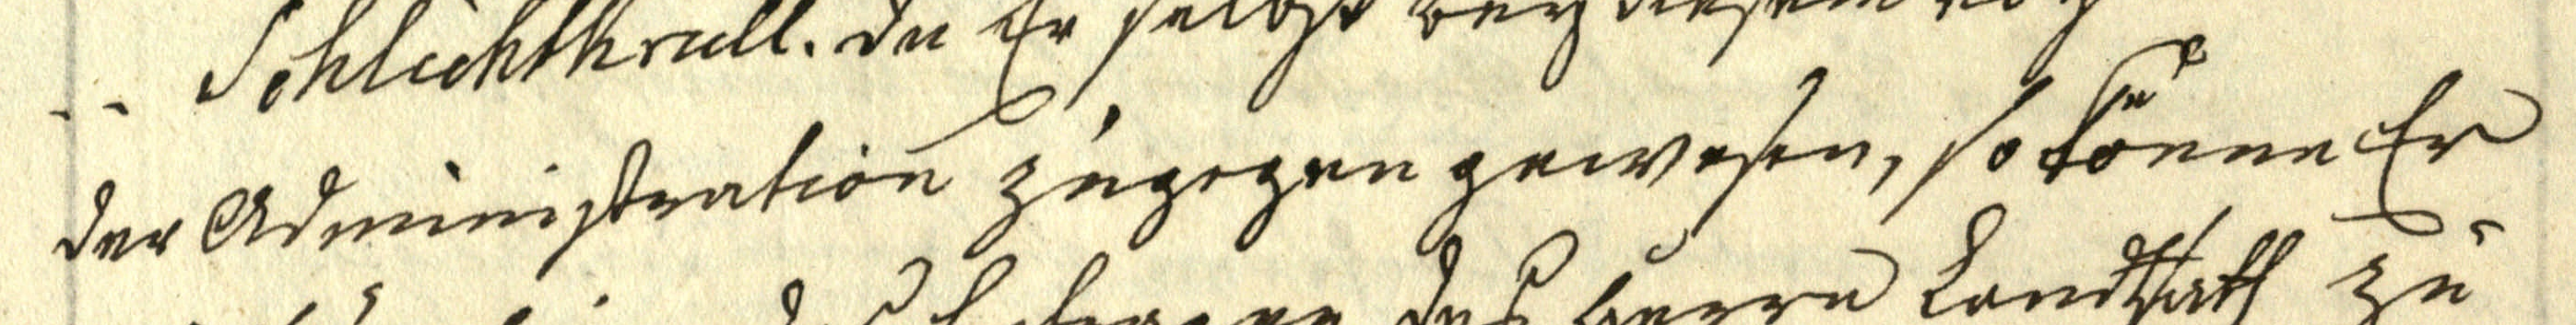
der Administration zugegen gewesen, so könne Er
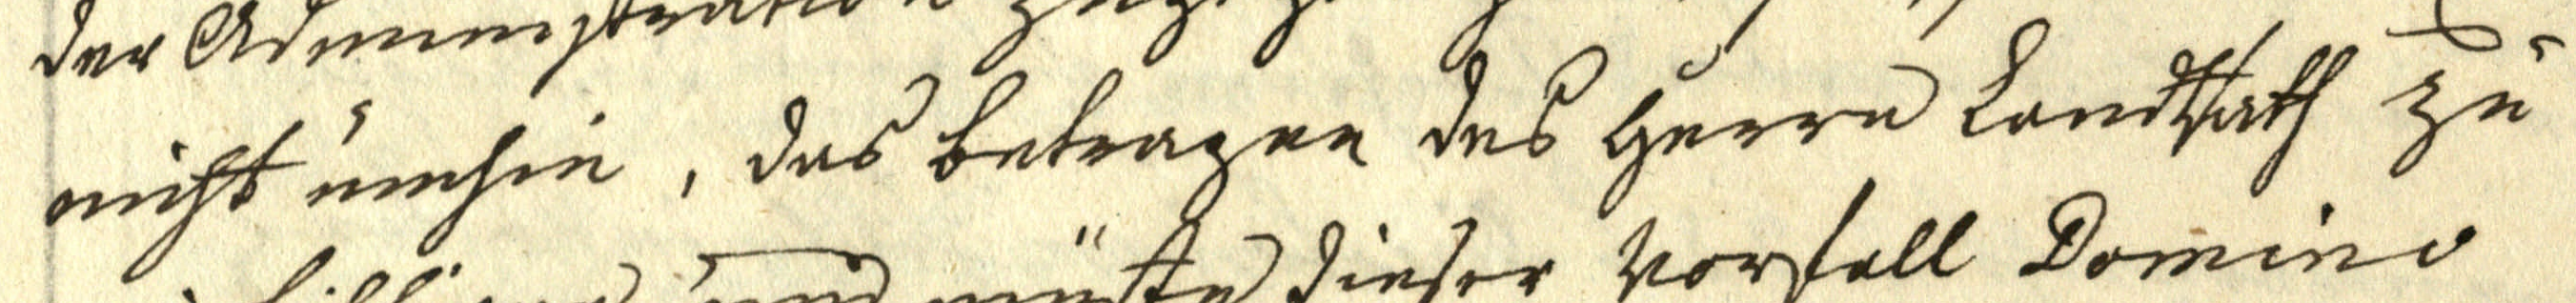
nicht umhin, das Betragen des Herrn LandRath zu
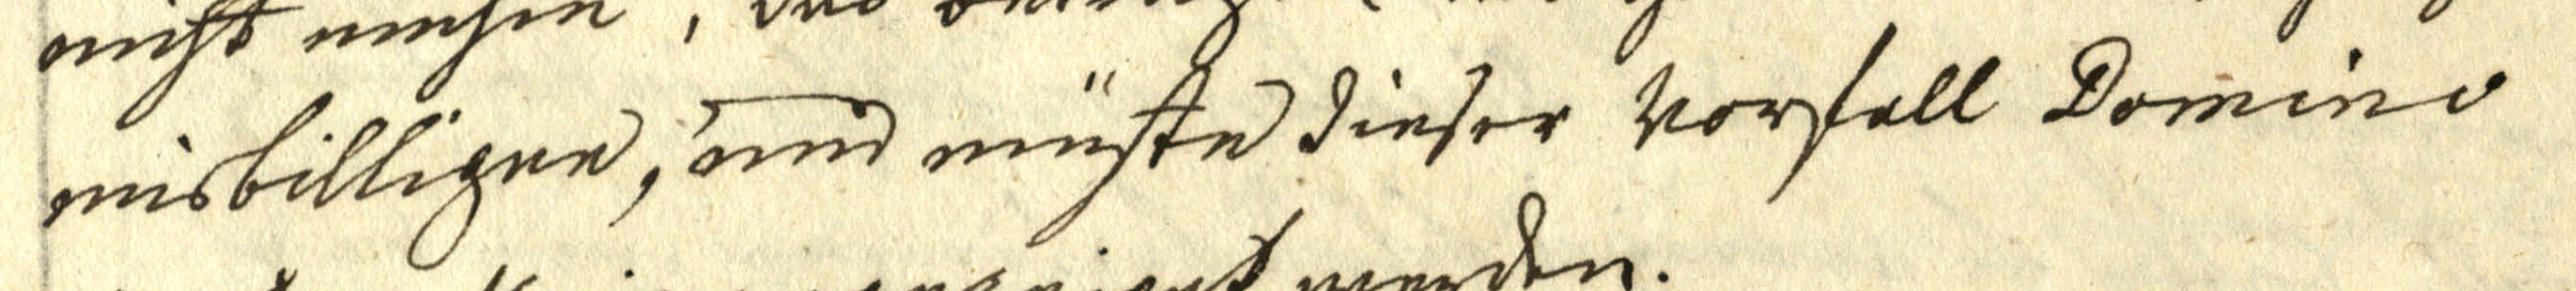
misbilligen, und müste dieser Vorfall Domino
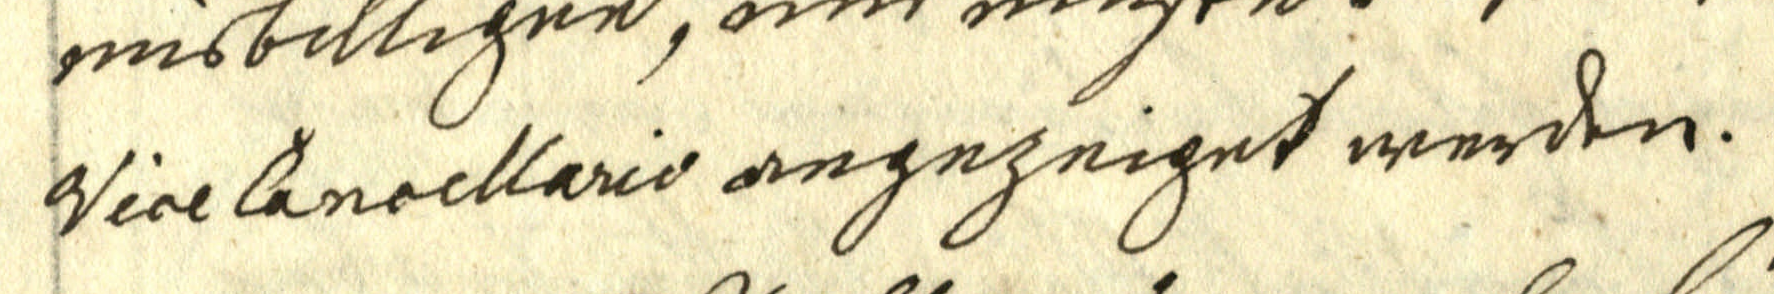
Vice Cancellario angezeiget werden.
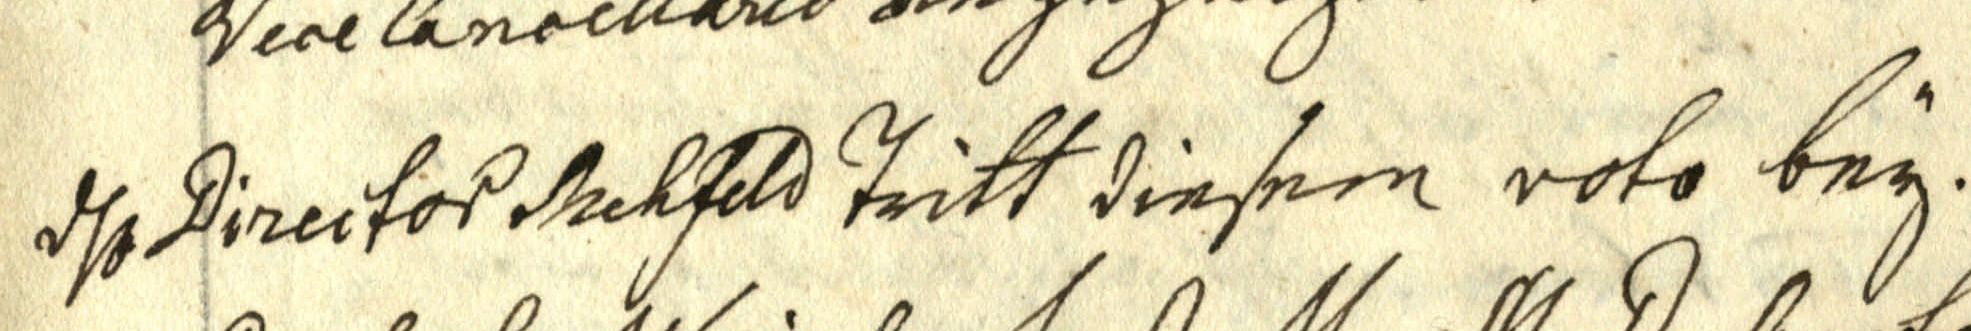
dh Director Rehfeld Tritt diesem voto beÿ.
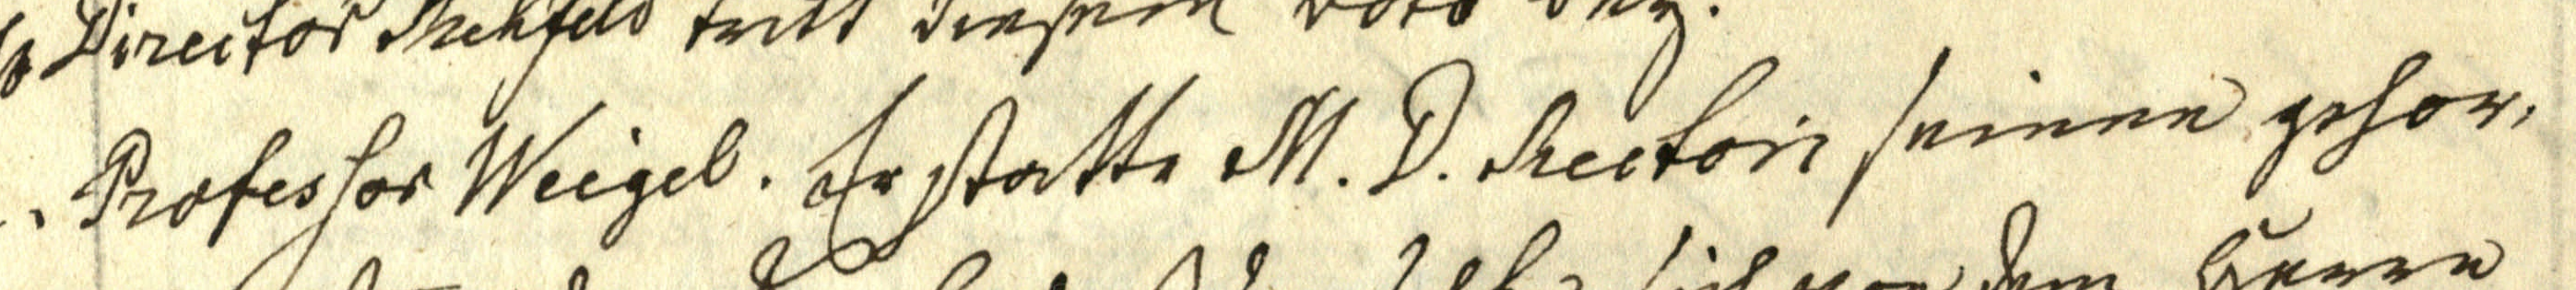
Professor Weigel. Er statte M. D. Rectori seinen gehor¬
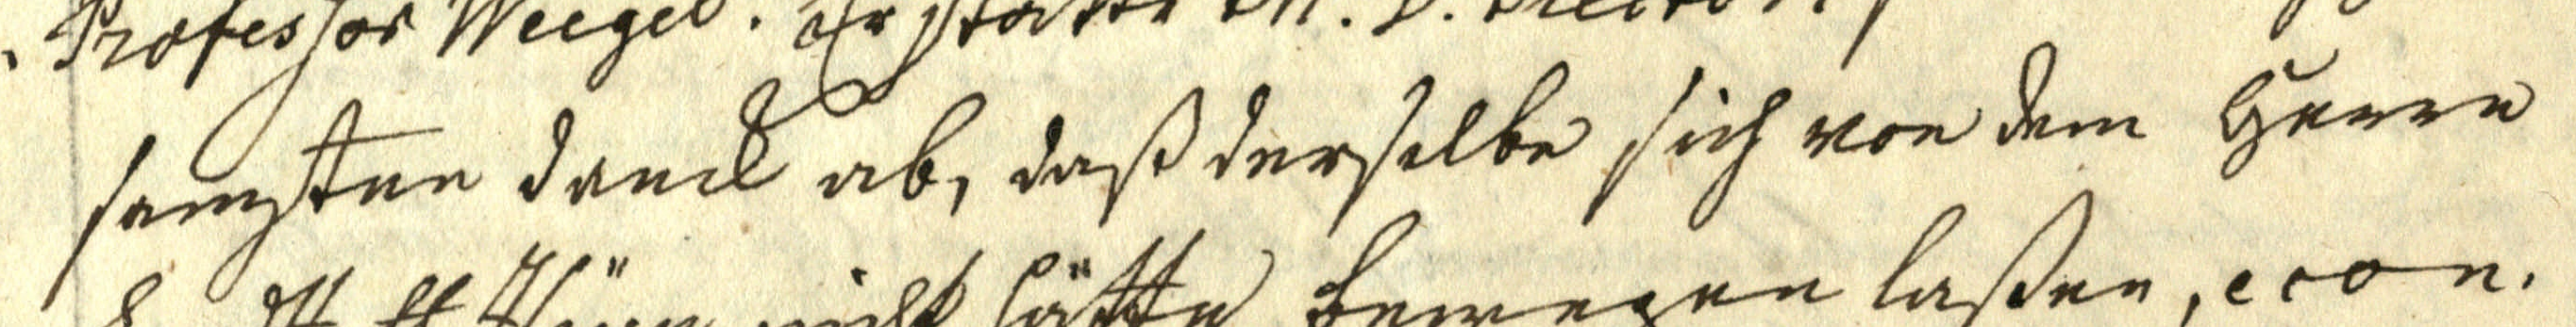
samsten Dank ab, daß derselbe sich von dem Herrn
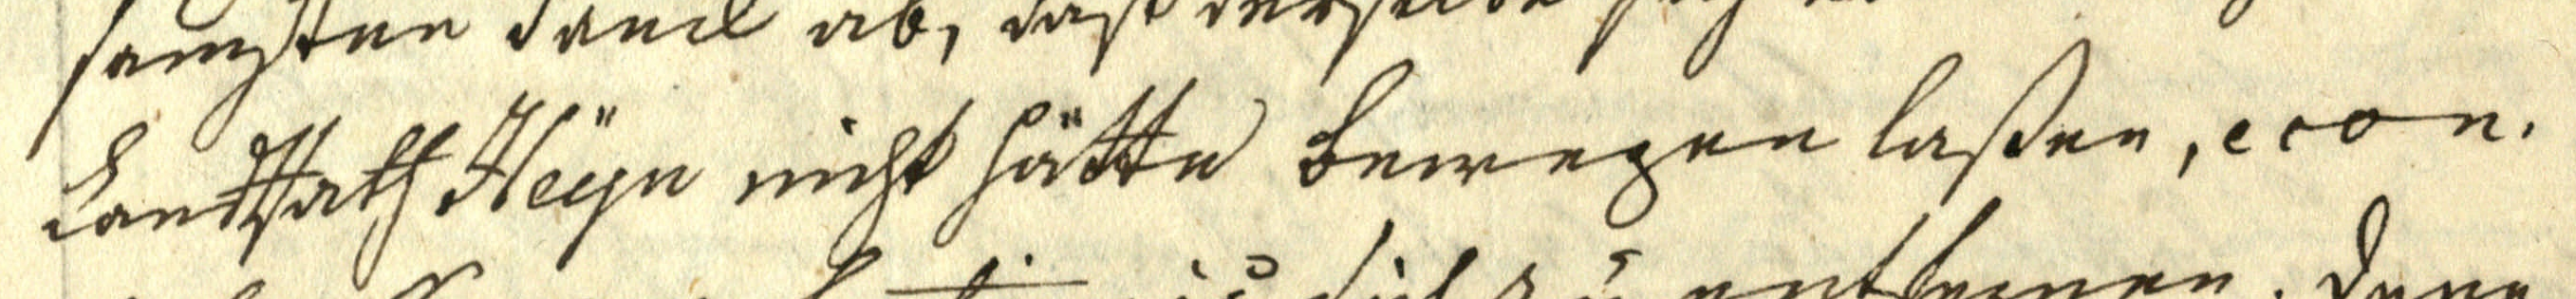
LandRath Heÿn nicht hätte bewegen laßen, e con¬
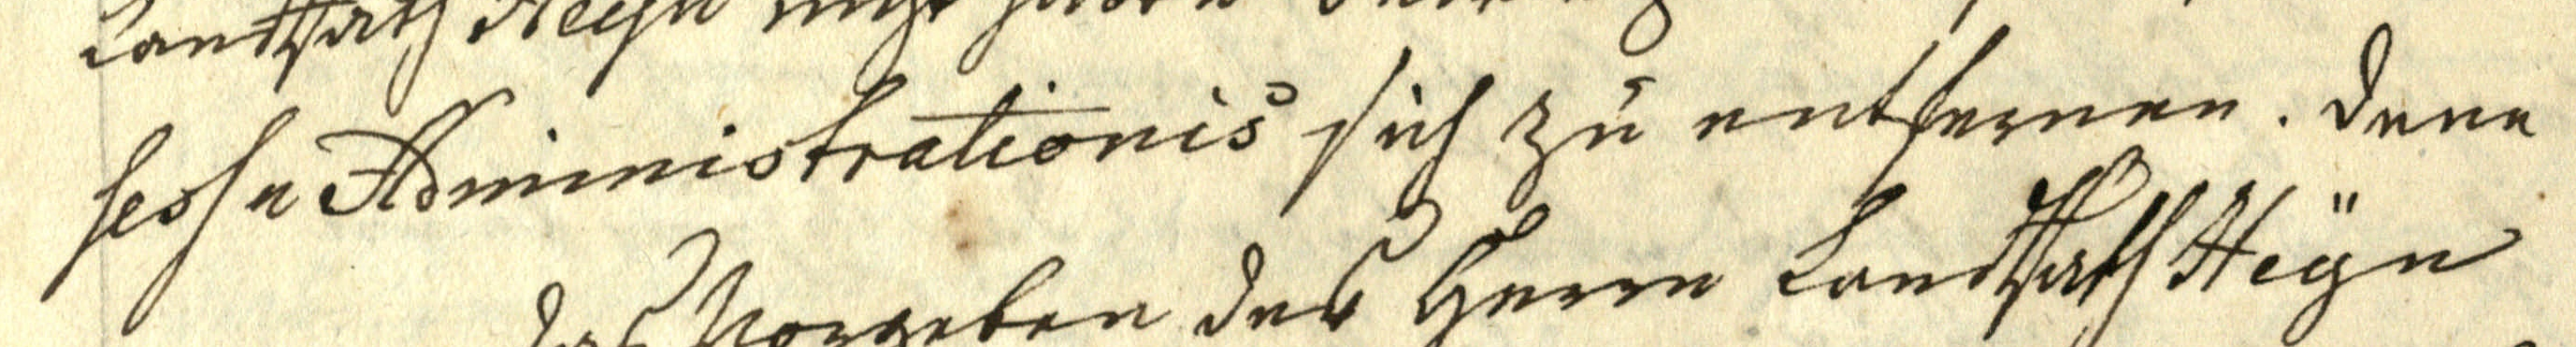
sessu Administrationis sich zu entfernen. Denn
